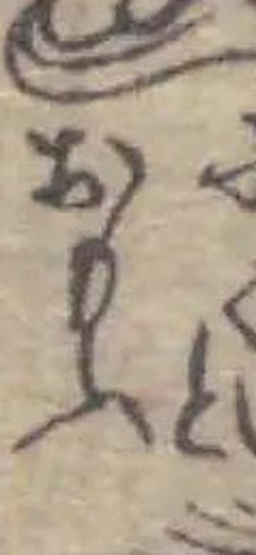おもふ
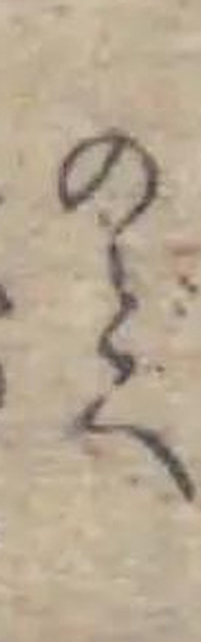のどへ
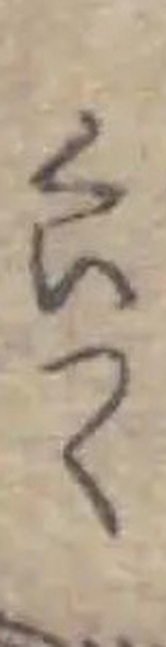くいつく
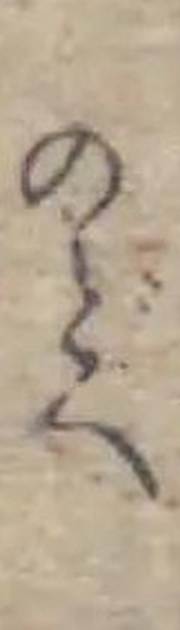のどへ

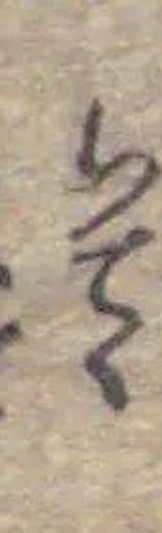いでゝ
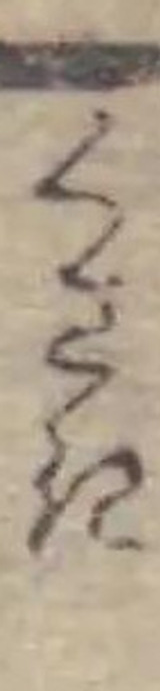くさき
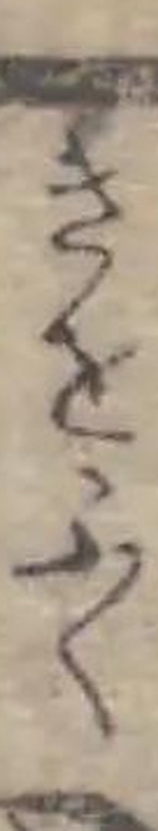きをふく
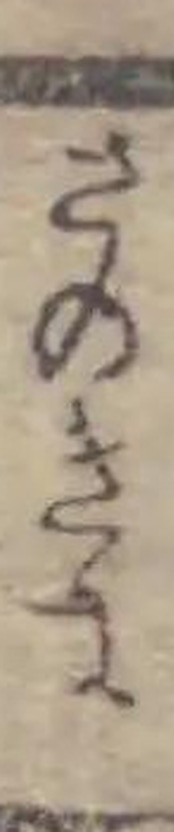さのきに
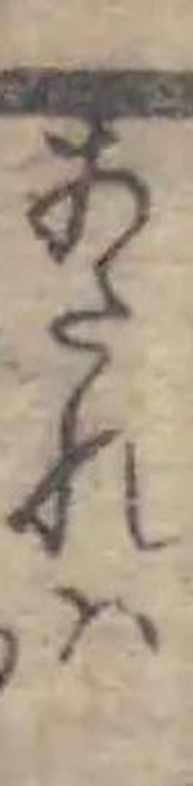あたれは
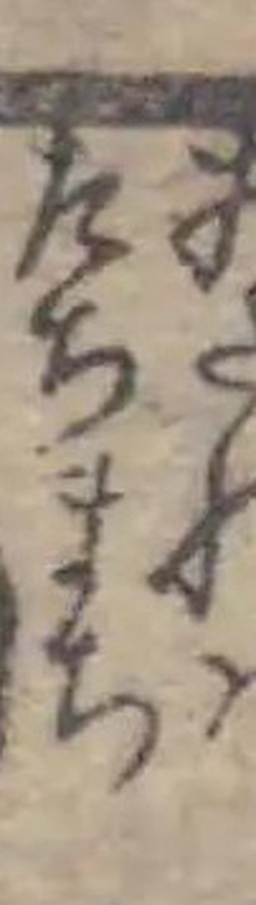たちまち
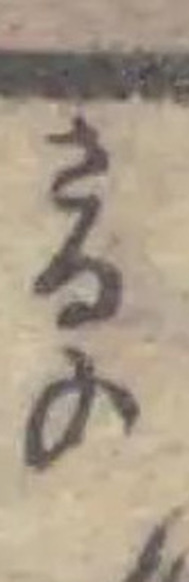さるの
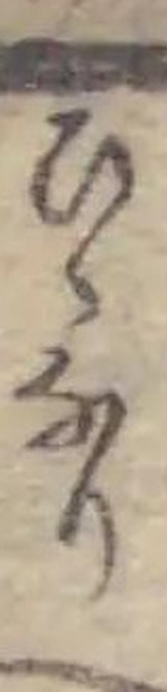ひゝなり
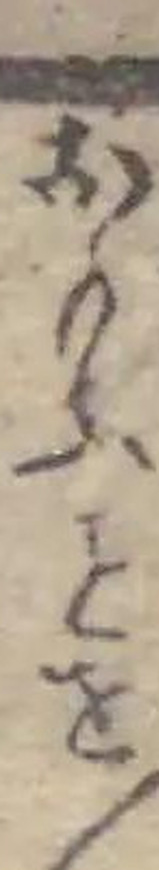おもふことを
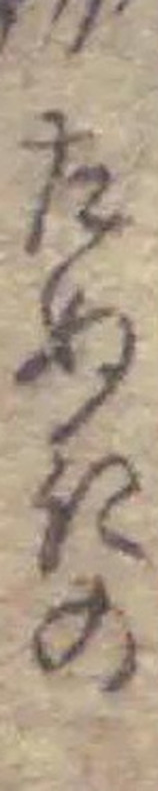たぬきの
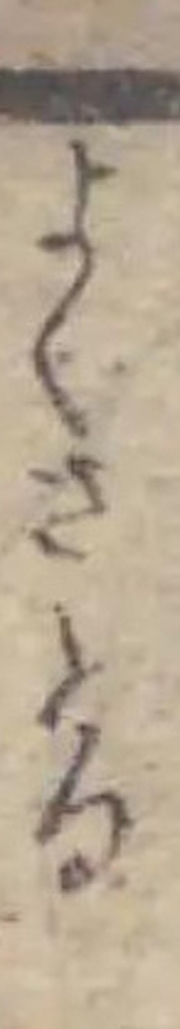よくさとる
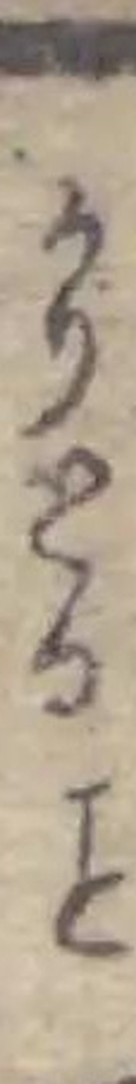かりとること
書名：夭怪着到牒 2巻
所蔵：国立国会図書館 National Diet Library, JAPAN
